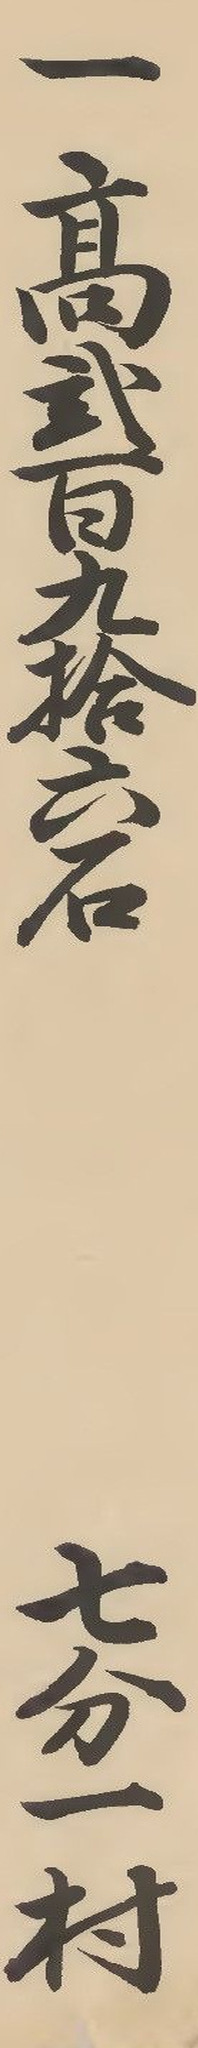一高弐百九拾六石七分一村
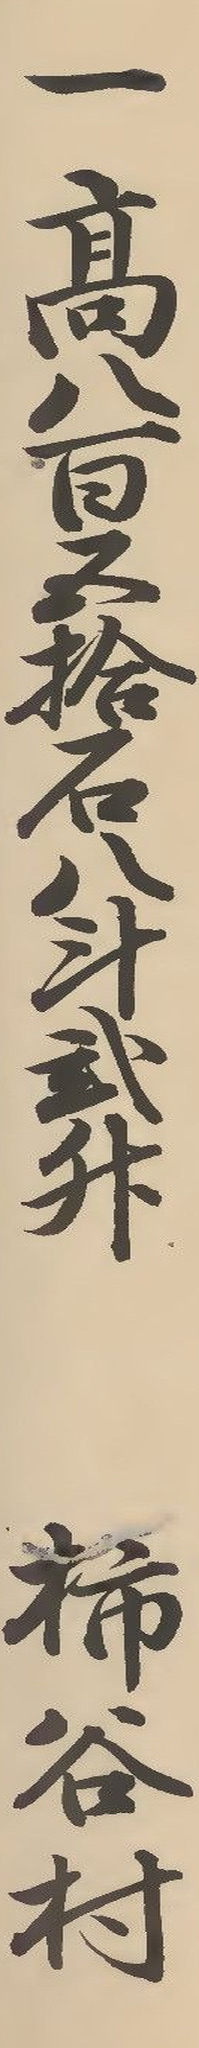一高八百五拾石八斗弐升柿谷村
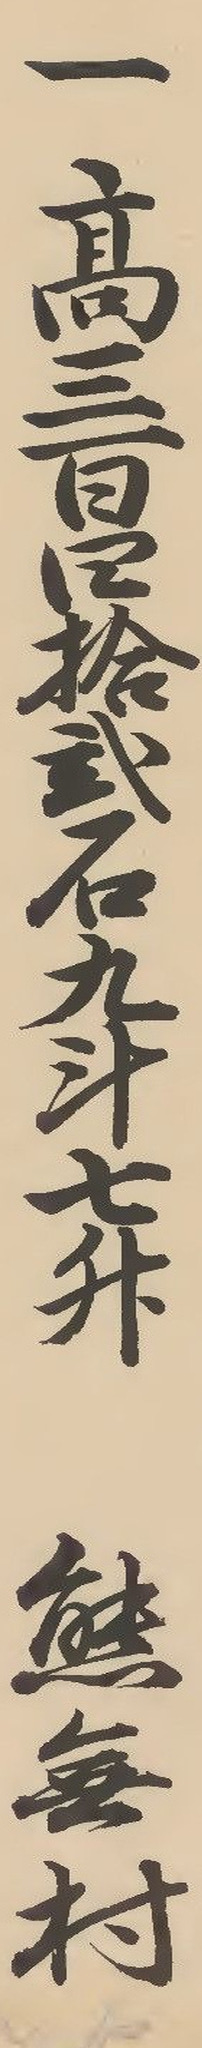一高三百四拾弐石九斗七升熊無村
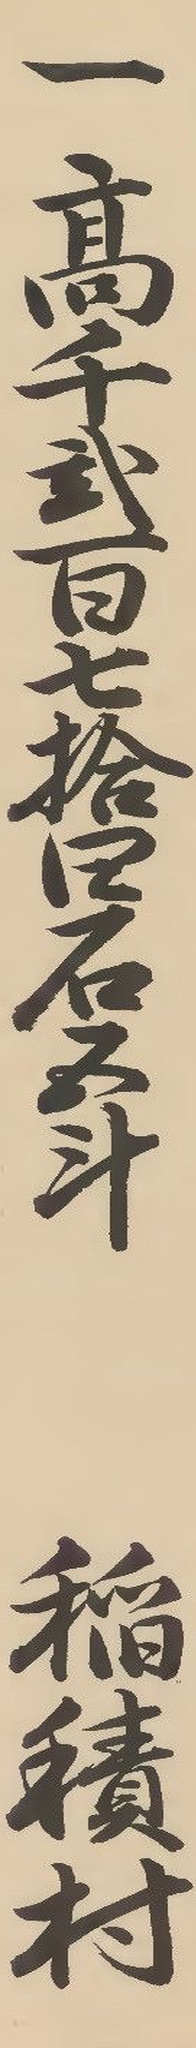一高千弐百七拾四石五斗稲積村
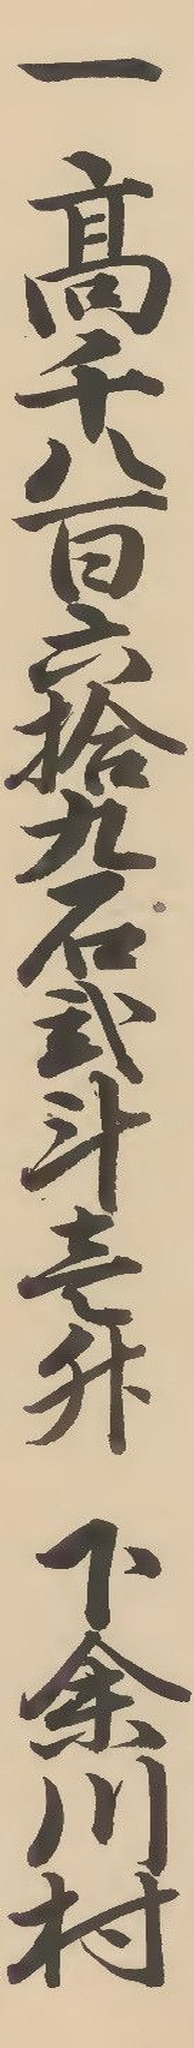一高千八百六拾九石弐斗壱升下余川村

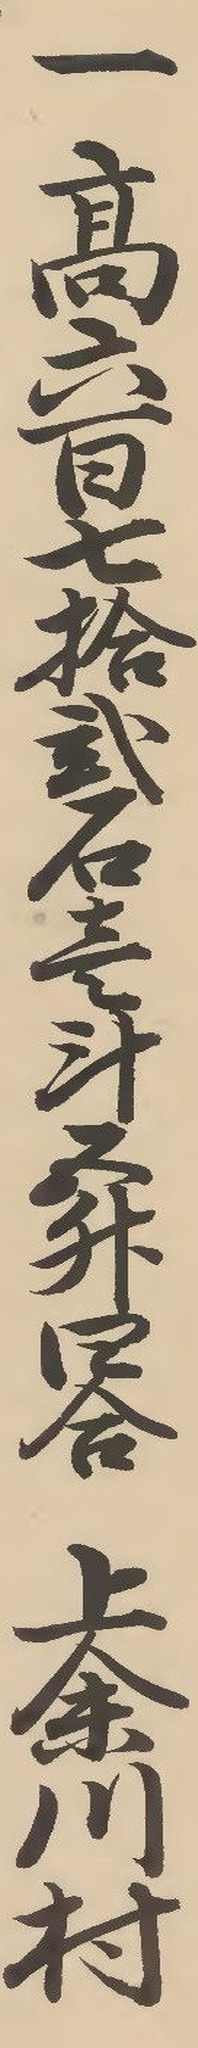一高六百七拾弐石壱斗五升四合上余川村
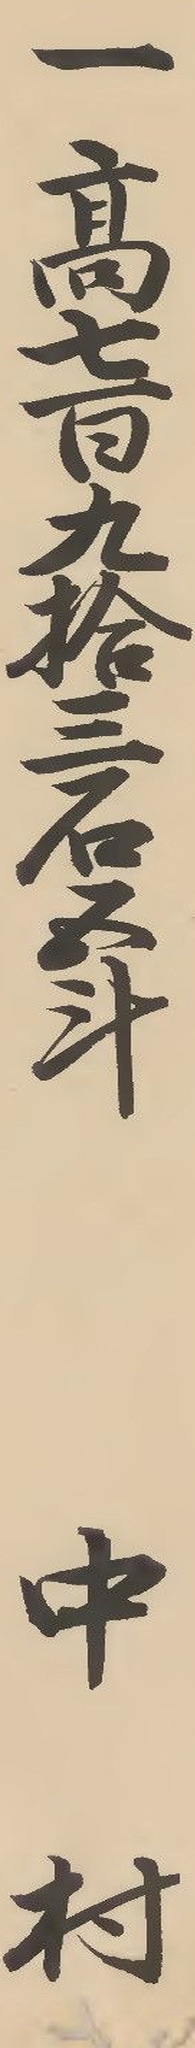一高七百九拾三石五斗中村
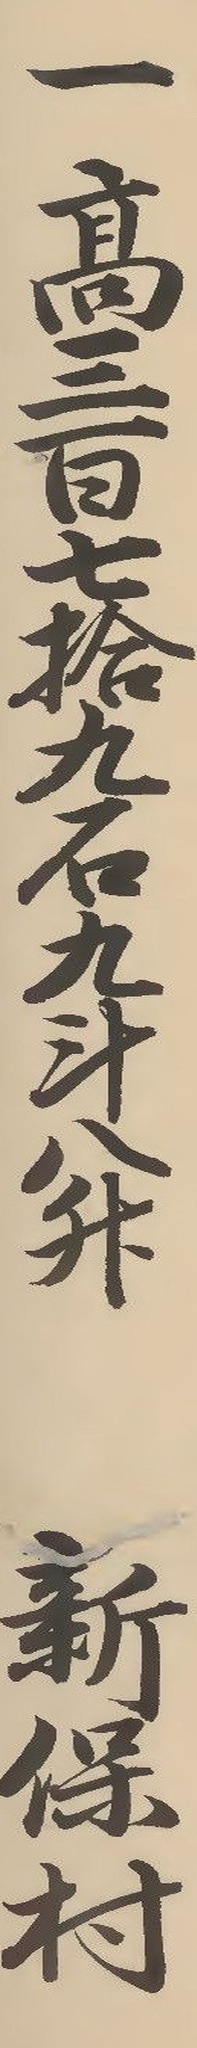一高三百七拾九石九斗八升新保村
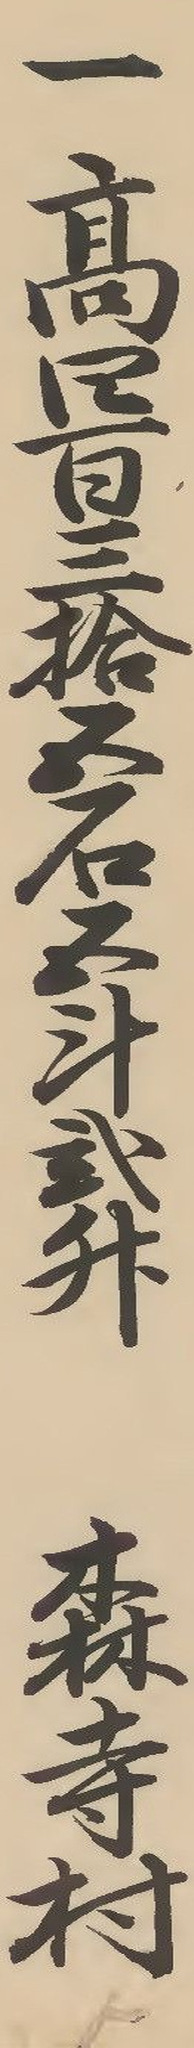一高四百三拾五石五斗弐升森寺村

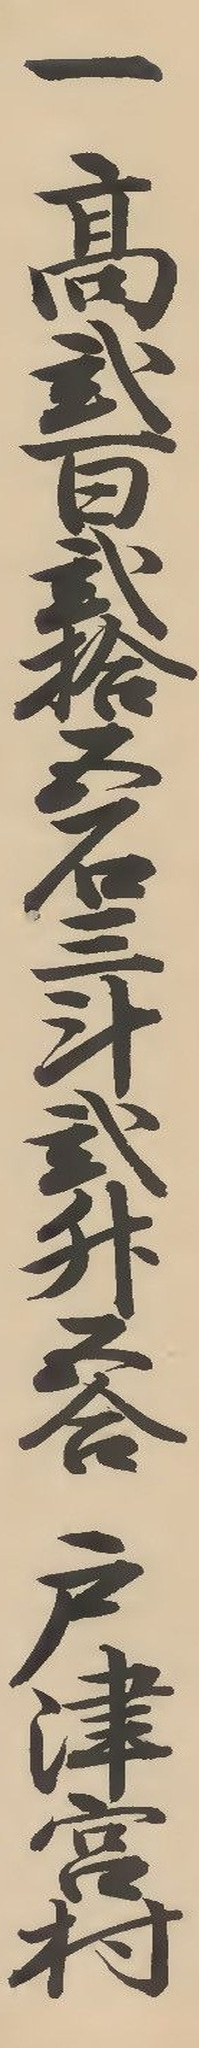一高弐百弐拾五石三斗弐升五合戸津宮村
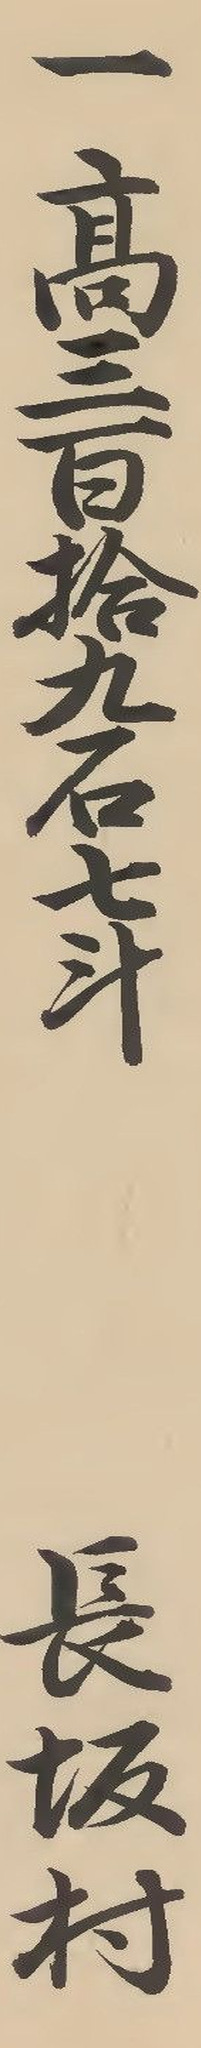一高三百拾九石七斗長坂村
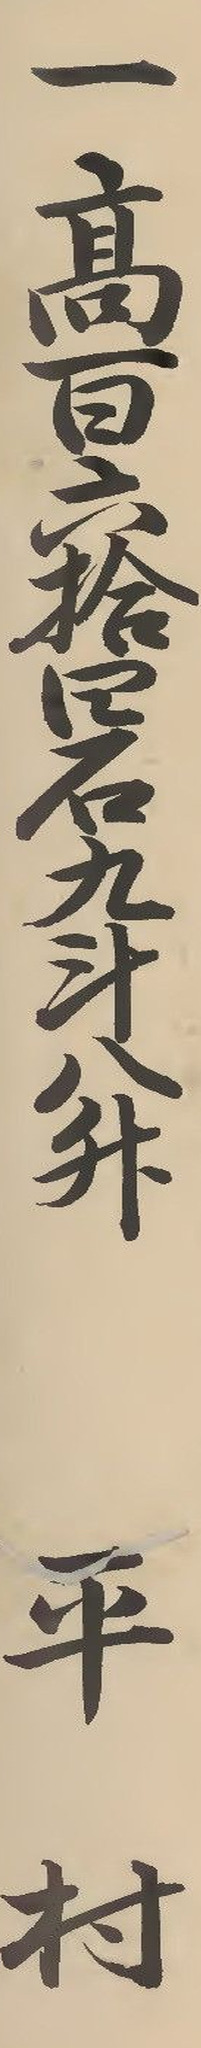一高百六拾四石九斗八升平村
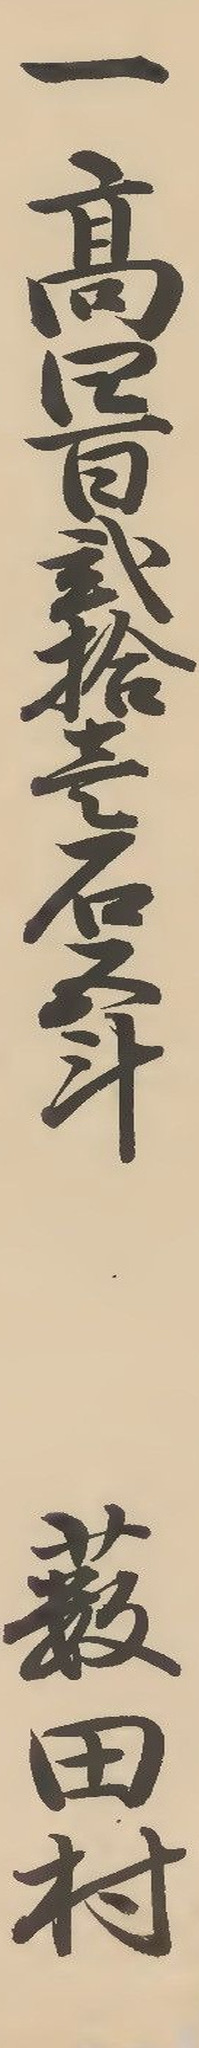一高四百弐拾壱石五斗薮田村

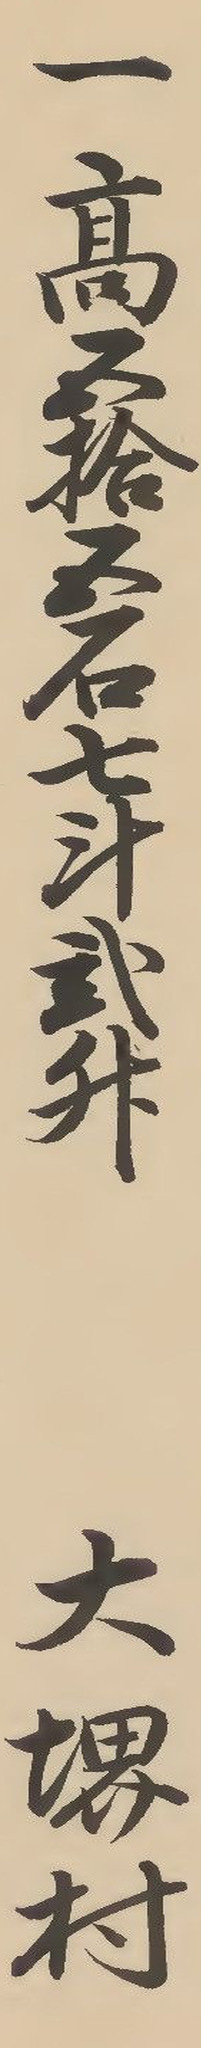一高五拾五石七斗弐升大堺村
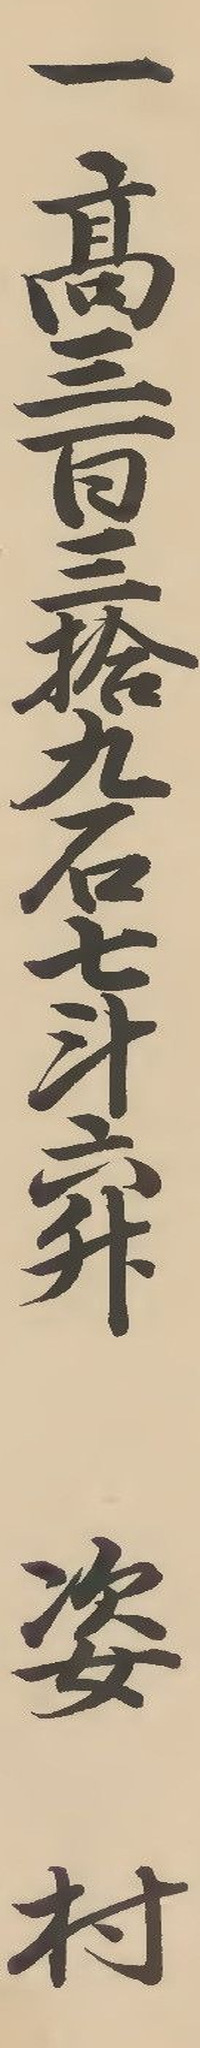一高三百三拾九石七斗六升姿村
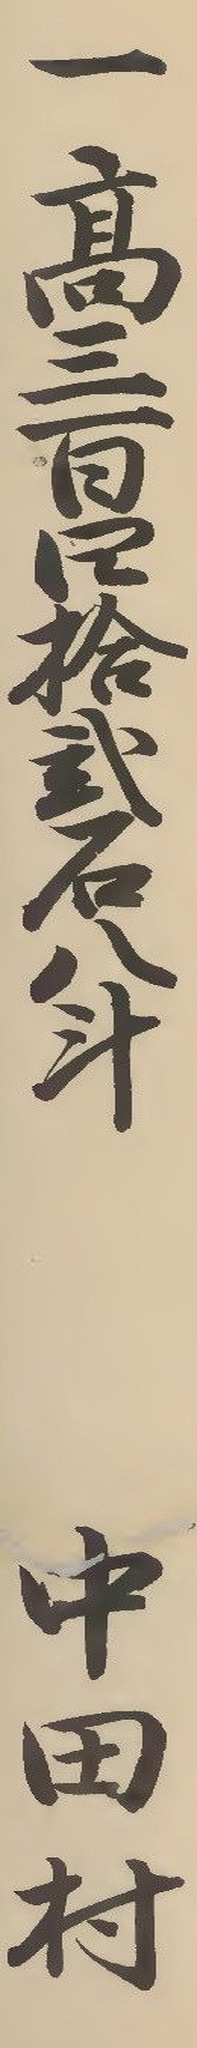一高三百四拾弐石八斗中田村
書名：越中国郷帳
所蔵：国立公文書館 National Archives of Japan
